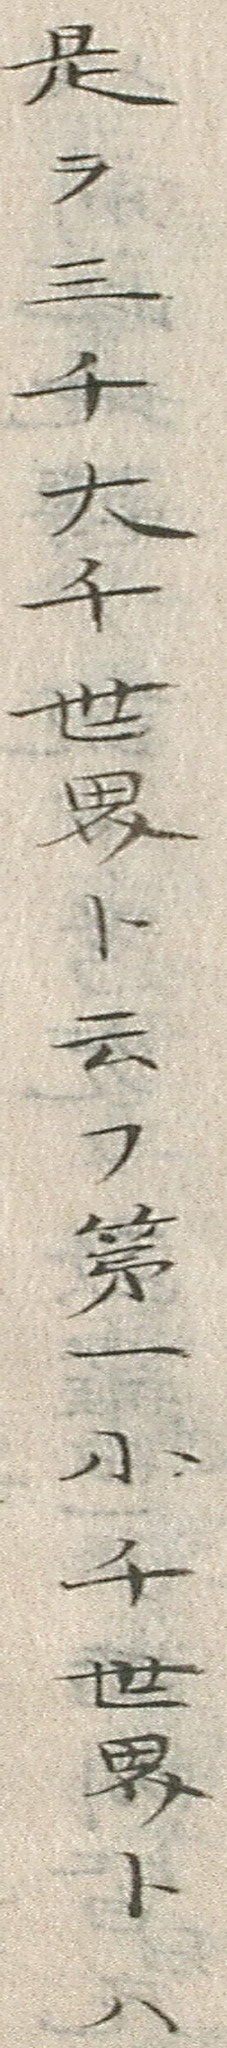是ヲ三千大千世界ト云フ第一小千世界トハ
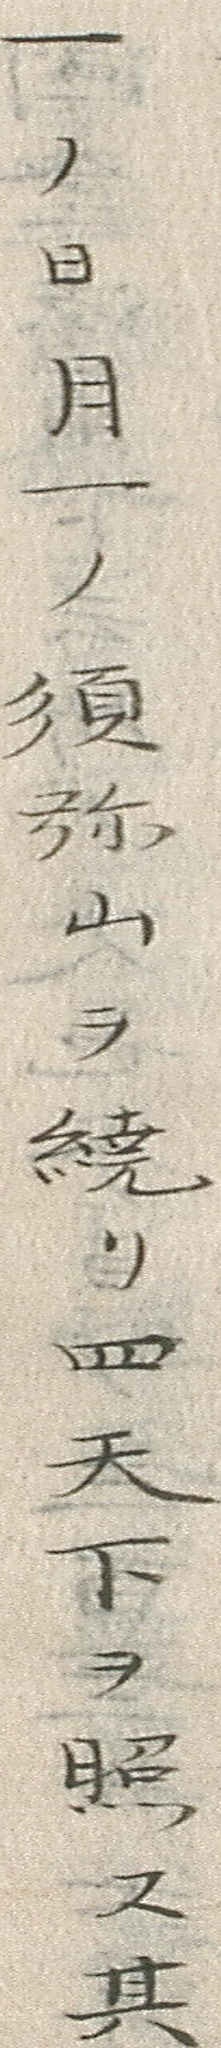一ノ日月一ノ須弥山ヲ繞リ四天下ヲ照ス其
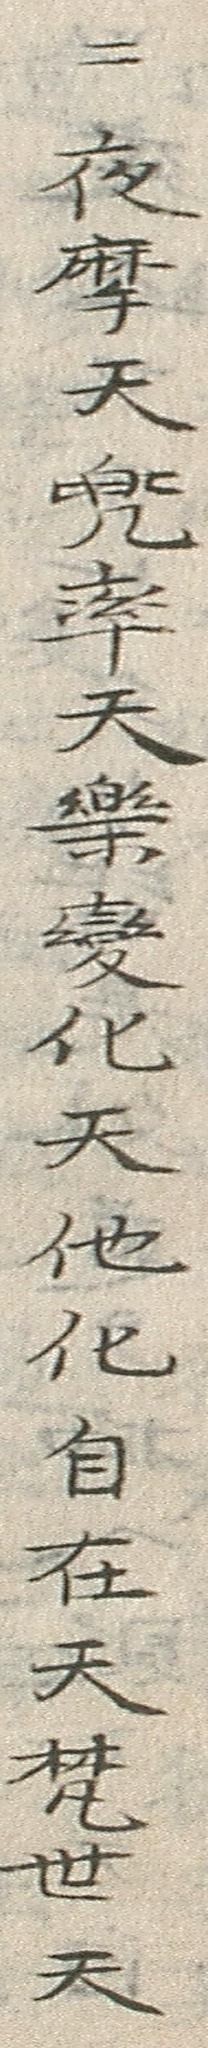ニ夜摩天兜率天楽変化天他化自在天梵世天
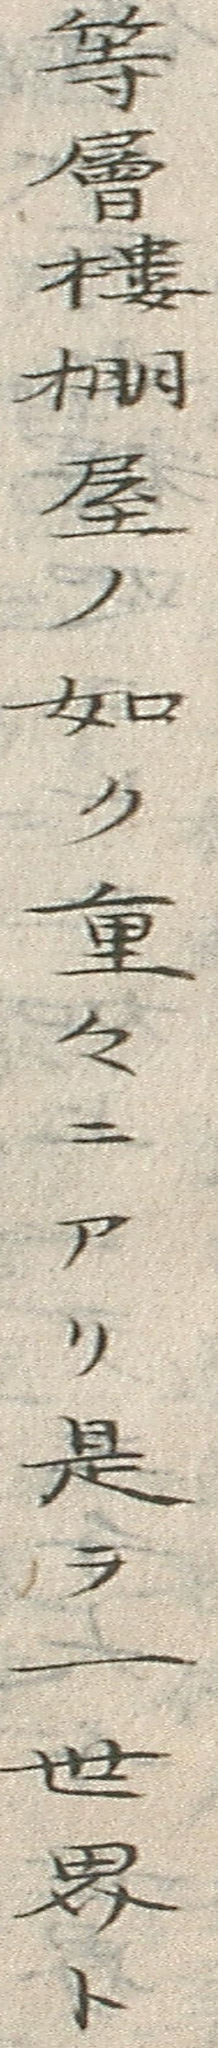等層樓棚屋ノ如ク重々ニアリ是ヲ一世界ト
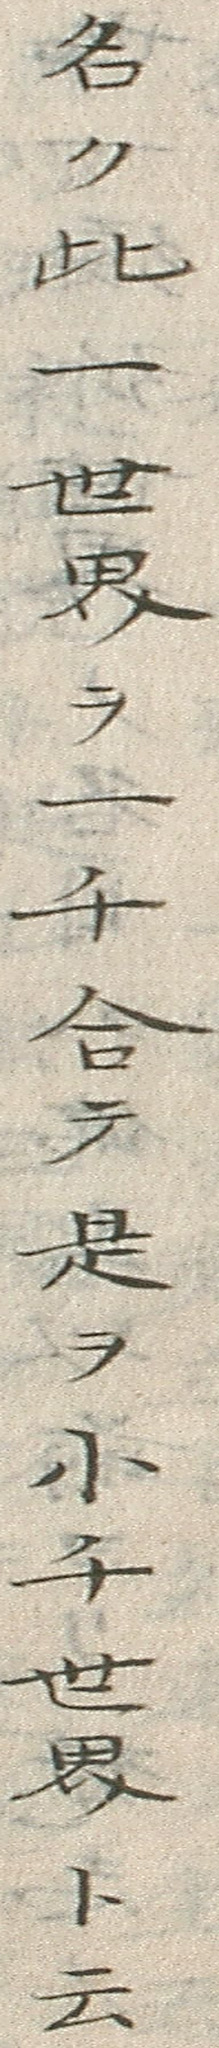名ク此一世界ヲ一千合テ是ヲ小千世界ト云
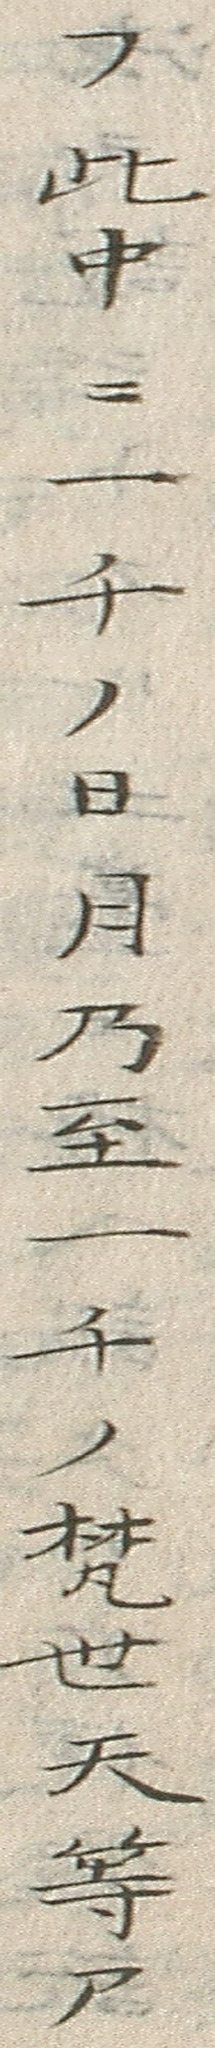フ此中ニ一千ノ日月乃至一千ノ梵世天等ア
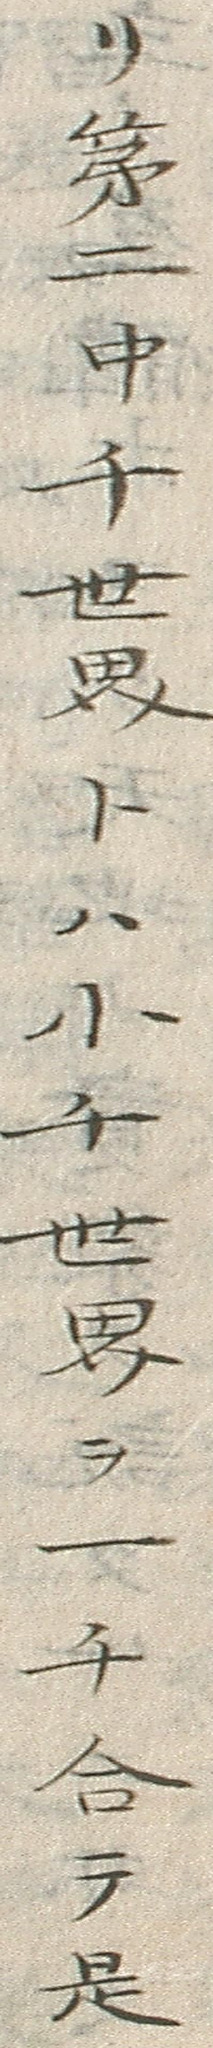リ第二中千世界トハ小千世界ニ一千合テ是
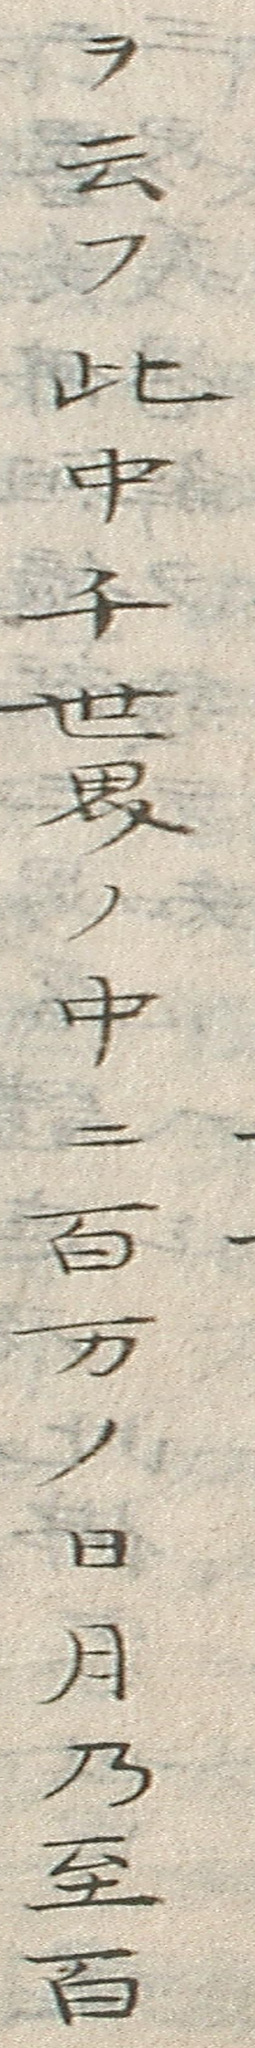ヲ云フ此中千世界ノ中ニ百万ノ日月乃至百
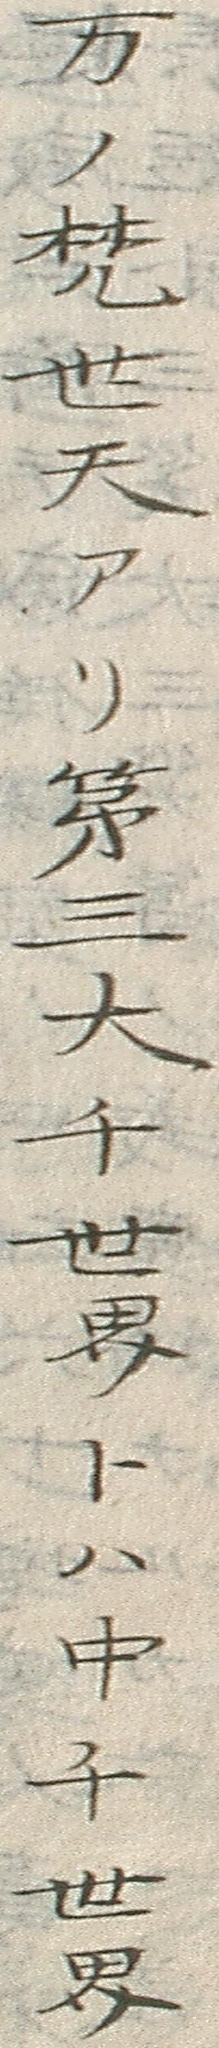万ノ梵世天アリ第三大千世界トハ中千世界
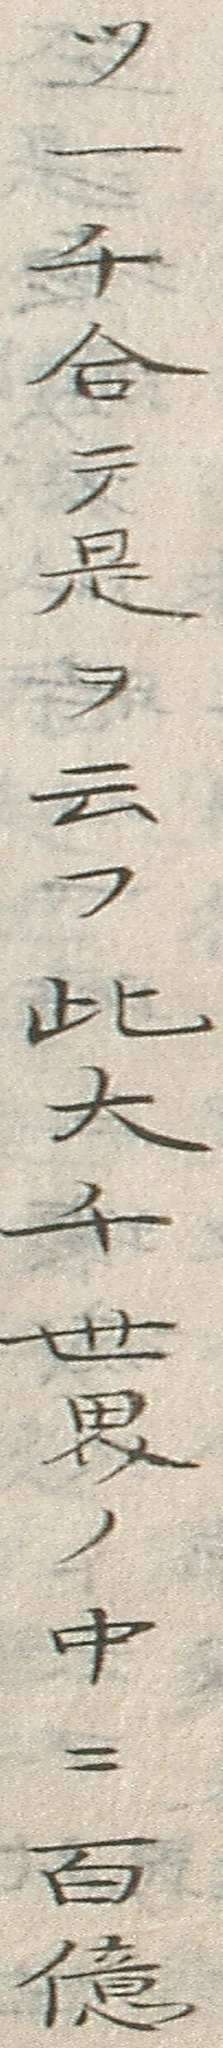ッ一千合テ是ヲ云フ此大千世界ノ中ニ百億
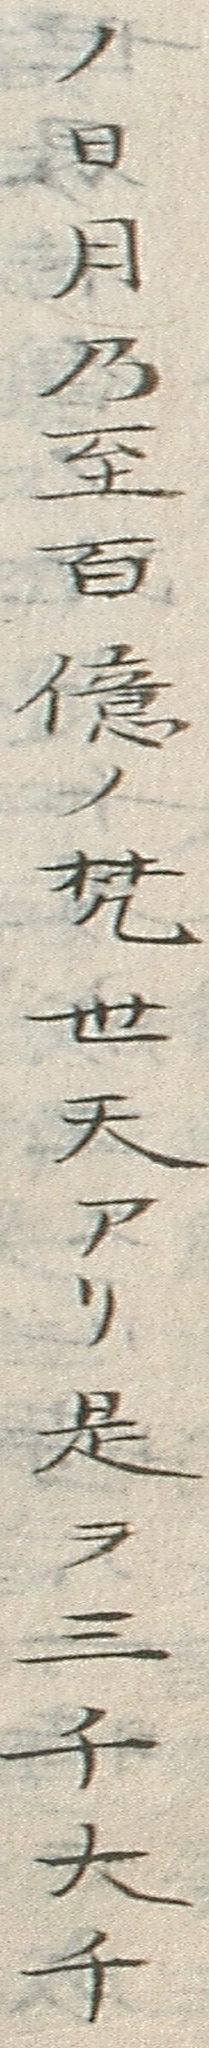ノ日月乃至百億ノ梵世天アリ是ヲ三千大千

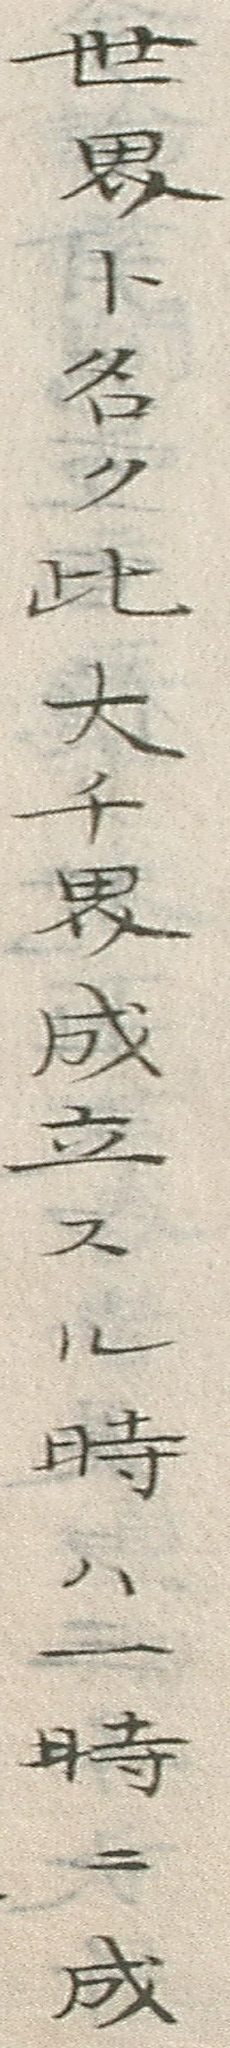世界ト名ク此大千界成立スル時ハ一時ニ成
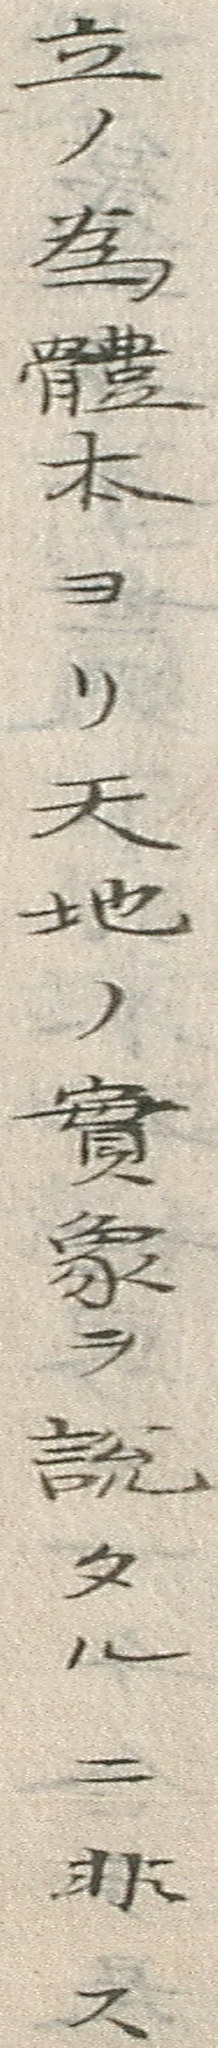立ノ為体本ヨリ天地ノ実象ヲ説タルニ非ス
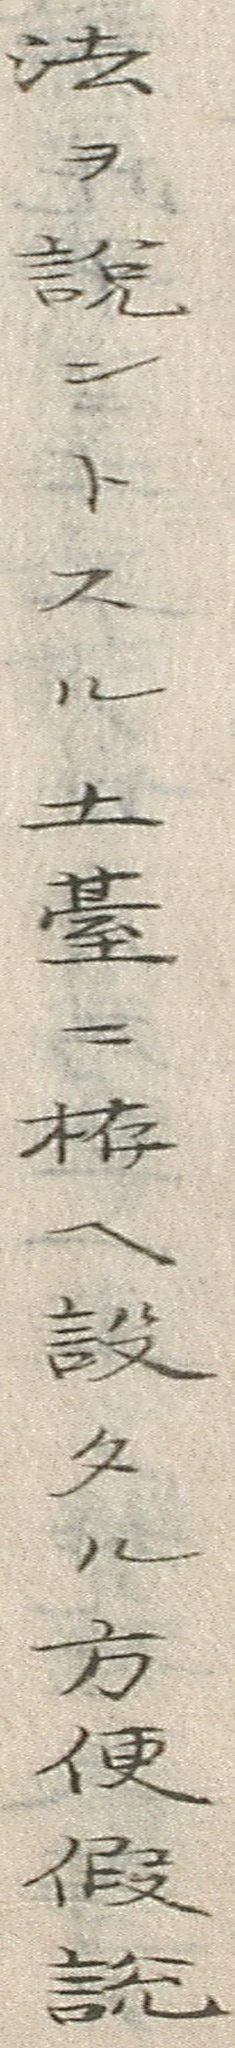法ヲ説ントスル土台ニ拵ヘ設タル方便仮説
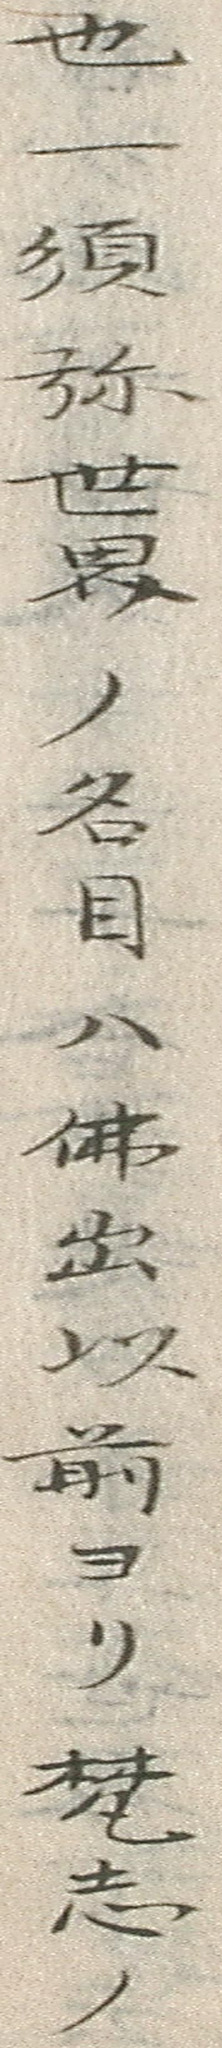也一須弥世界ノ名目ハ仏出以前ヨリ梵志ノ
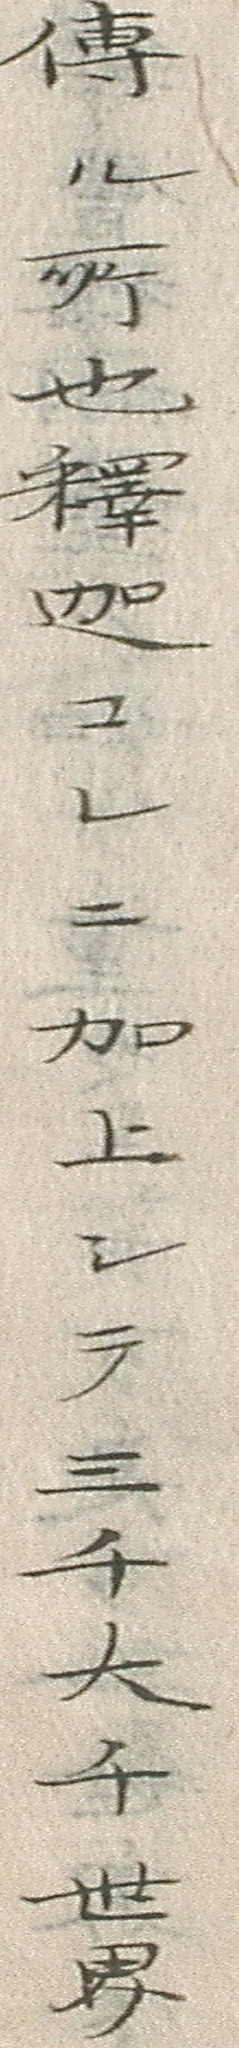伝ル所也釈迦コレニ加上シテ三千大千世界
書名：天學略名目羽翼　全
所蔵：東京大学地震研究所図書室 Earthquake Research Institute Library, The University of Tokyo, JAPAN
